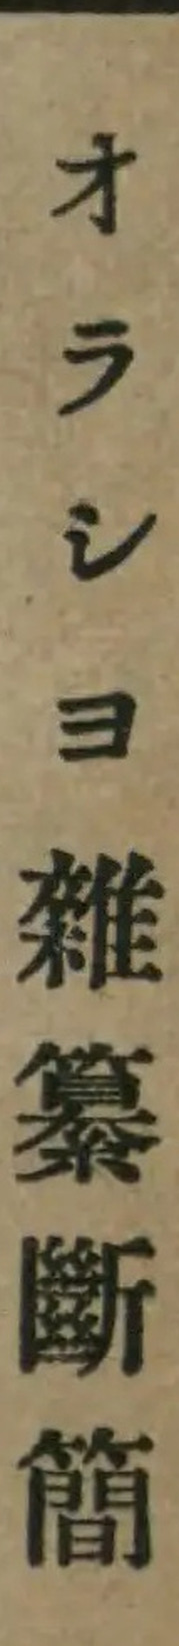オラシヨ雑纂断簡

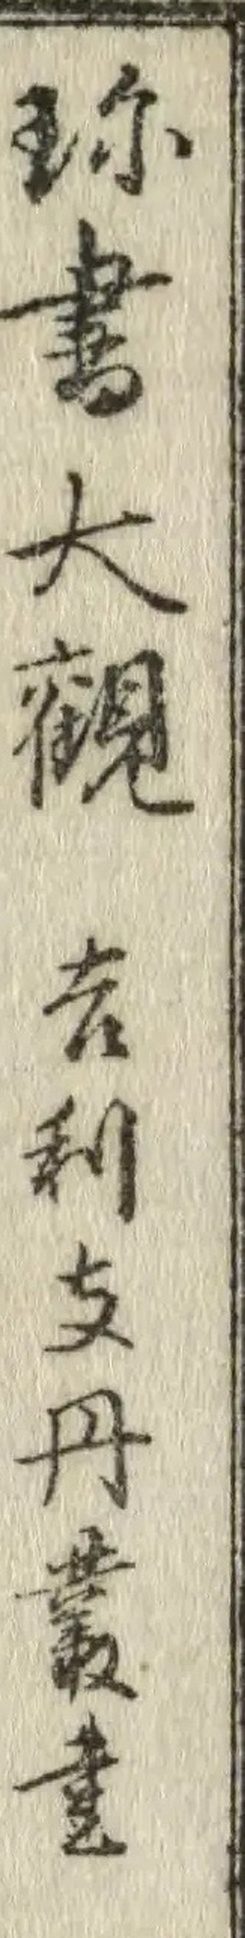珎書大観吉利支丹叢書
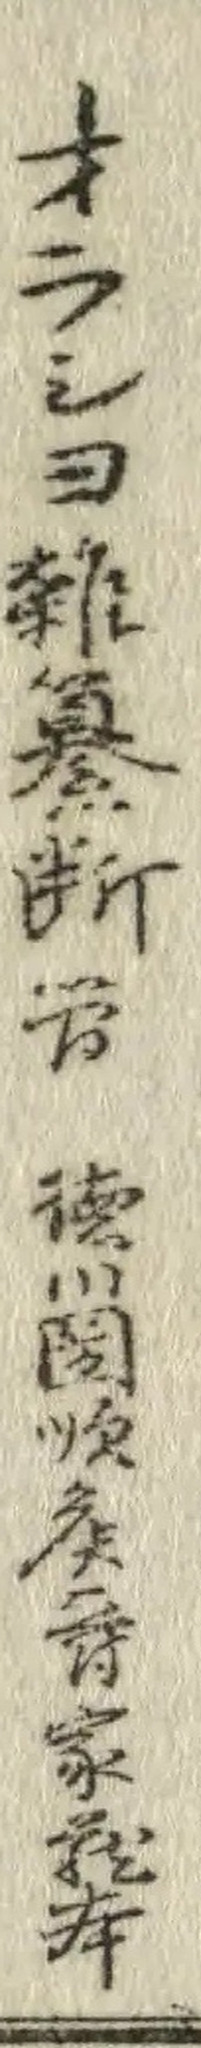オラシヨ雑纂断簡徳川圀順矦爵家蔵本
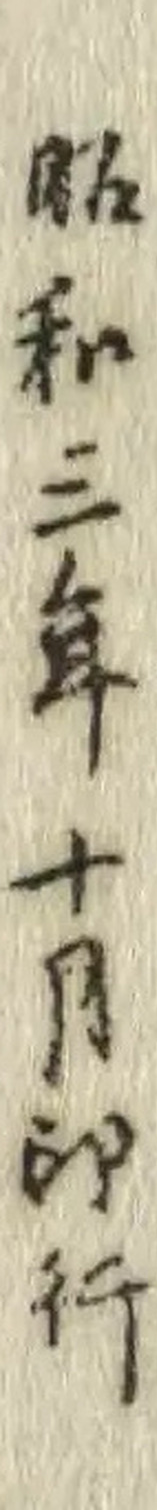昭和三年十月印行
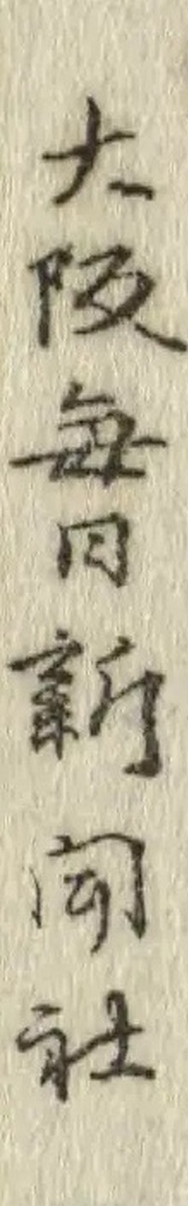大阪毎日新聞社
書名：オラシヨ雑纂断簡
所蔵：国立国会図書館 National Diet Library, JAPAN
